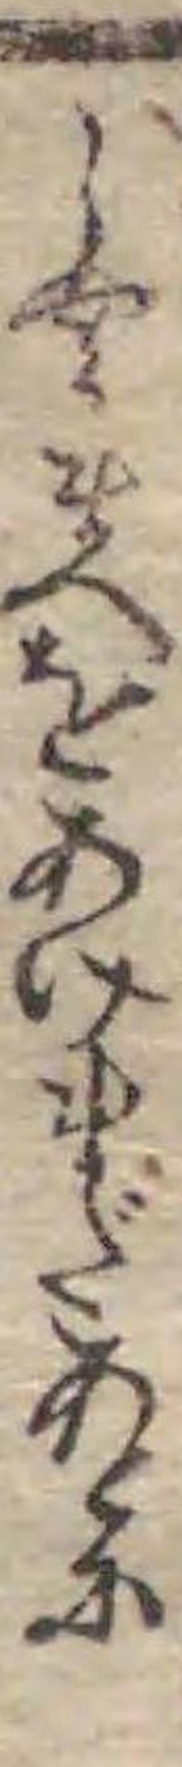しやうまへをあけまだあとに
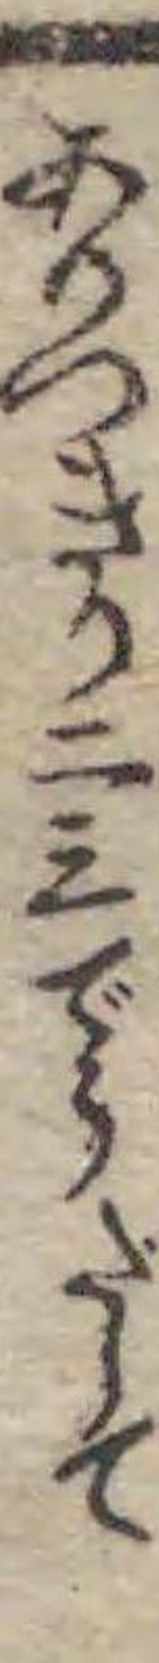ありつきり二三でうだして
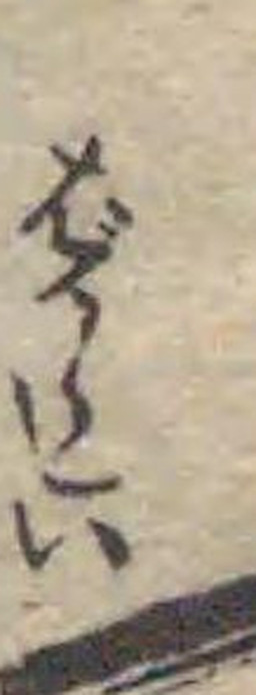ばからしい
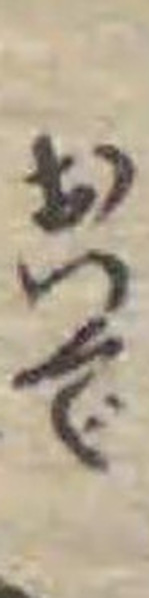おいで
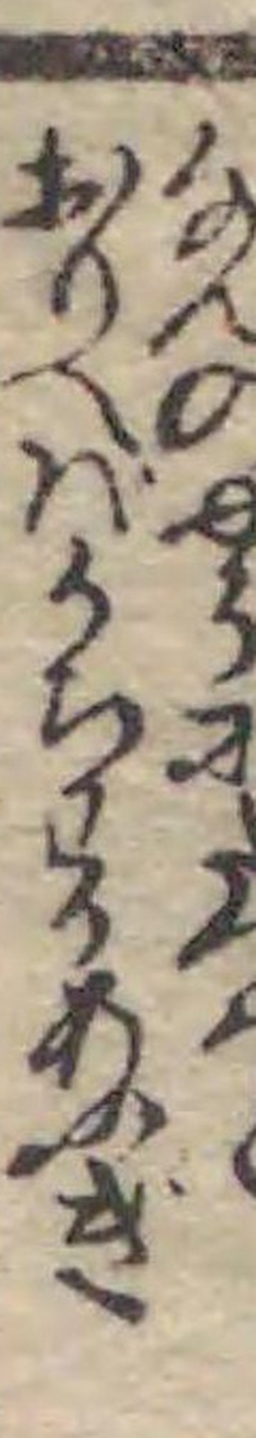おもへばうちわかあふぎ
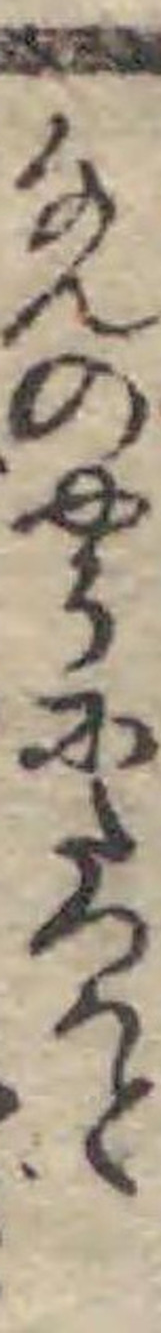なんのやうにたつかと
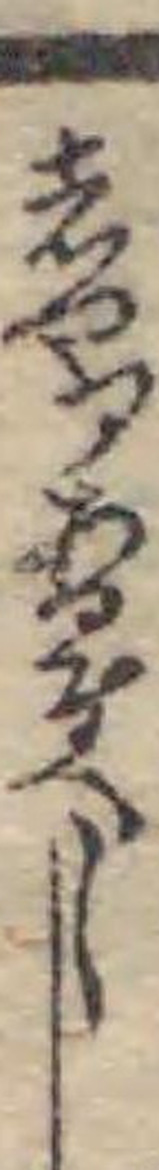しやアあるまへし
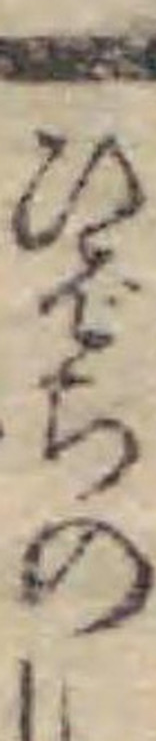ひばちの
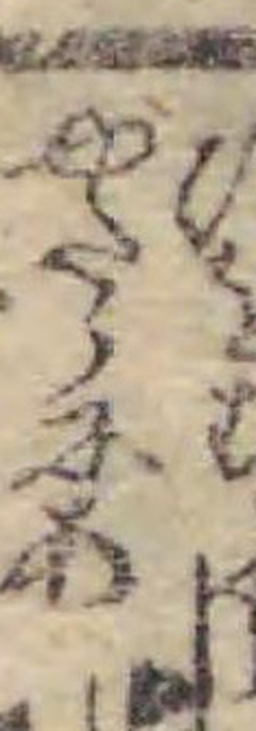やたらにあ
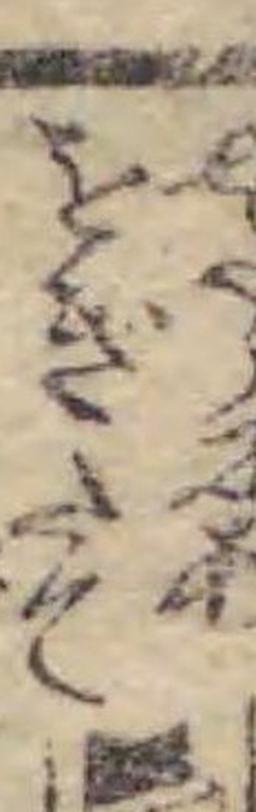をぎたて
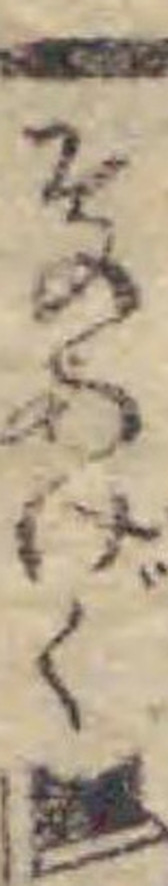そのあげく
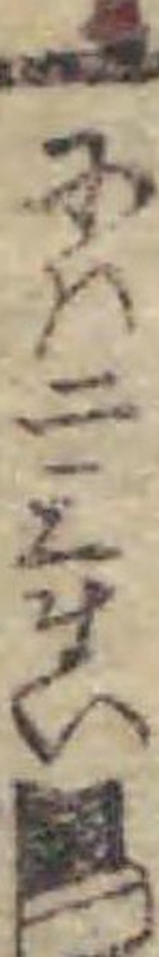には二三まい
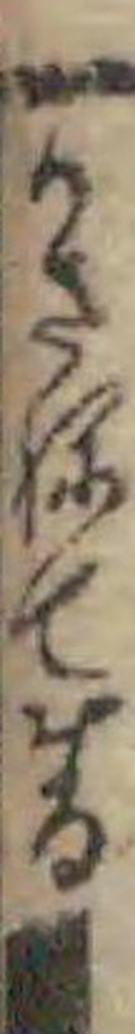かさねてまる
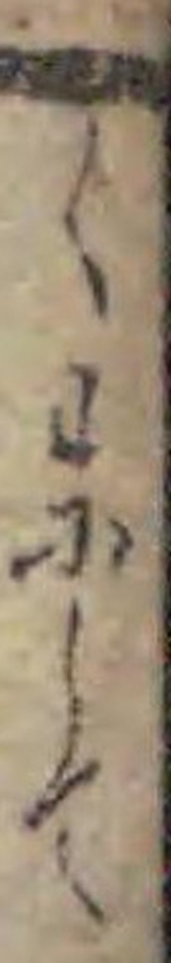くわにして
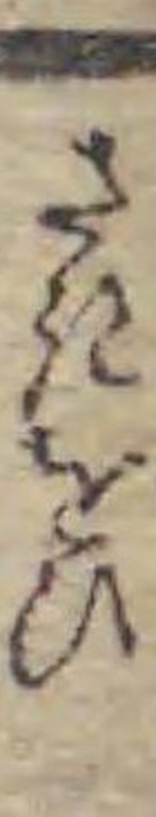さきをひ
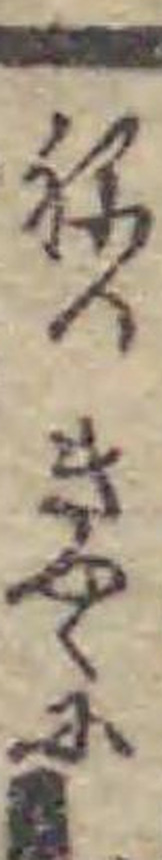ねりきやくに
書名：紙屑身上噺 : 3巻
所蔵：国立国会図書館 National Diet Library, JAPAN
